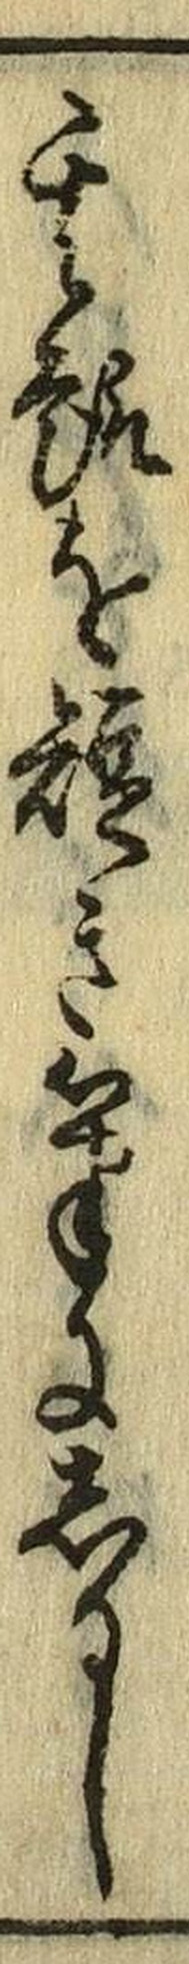其趣を短き筆にしるし
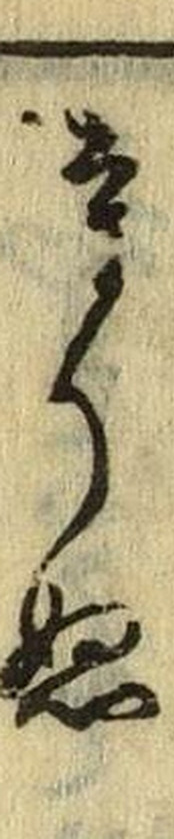侍りぬ
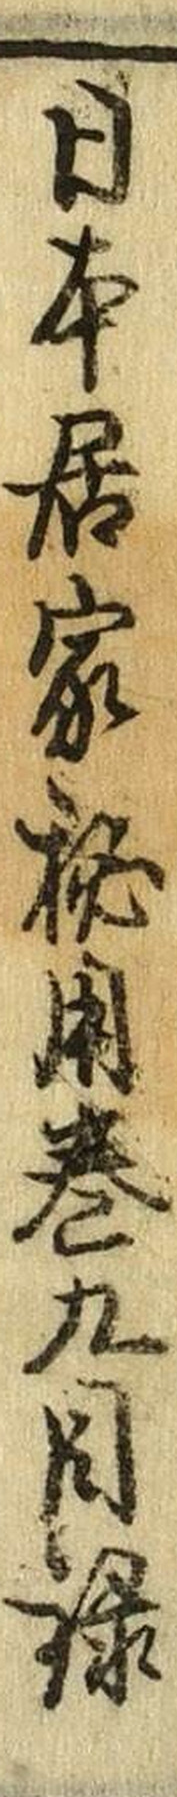日本居家秘用巻九目録
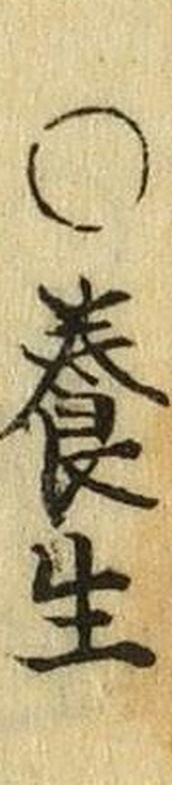◯養生
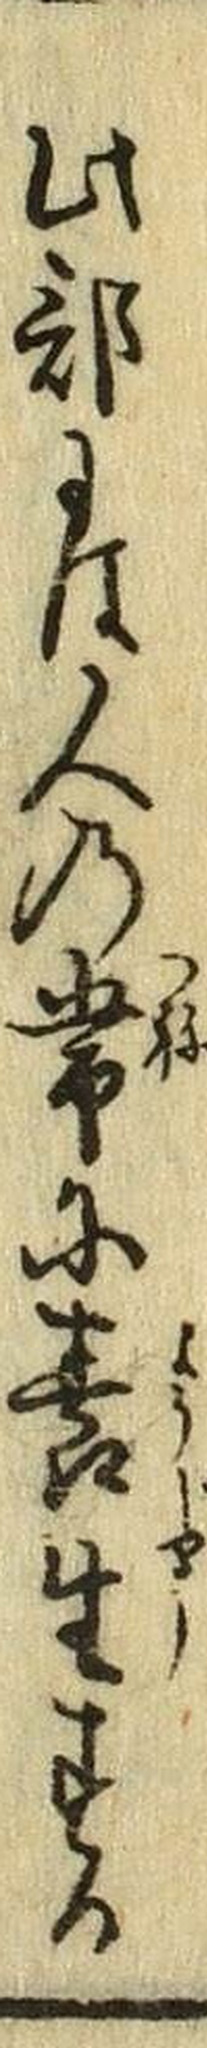此部には人の常に養生する
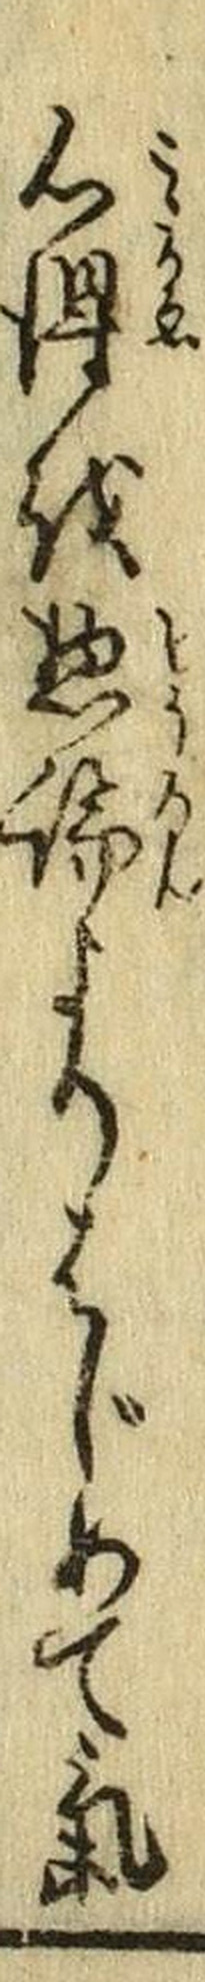心得を惣論よりはじめて気
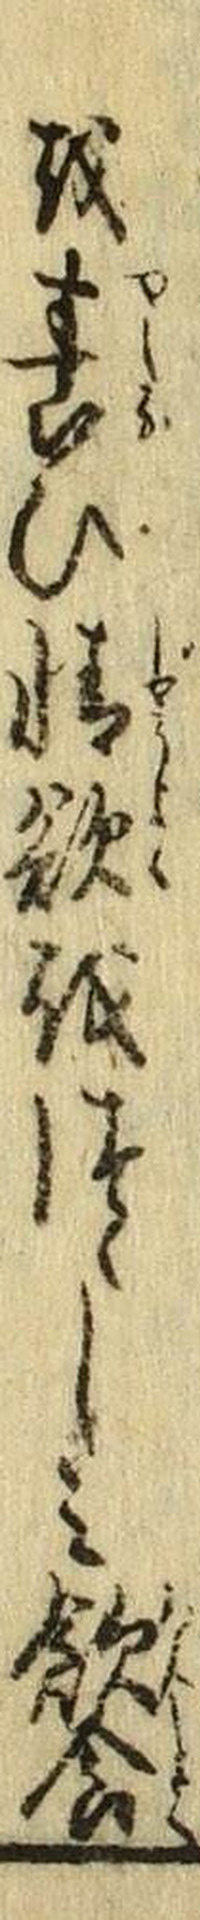を養ひ情欲をつゝしみ飲食
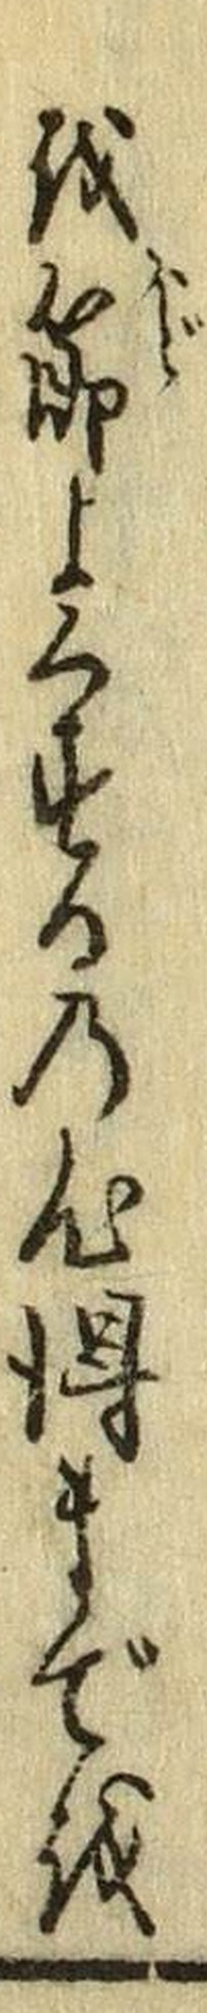を節よくするの心得までを
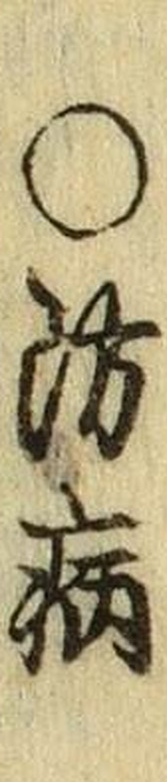◯防病
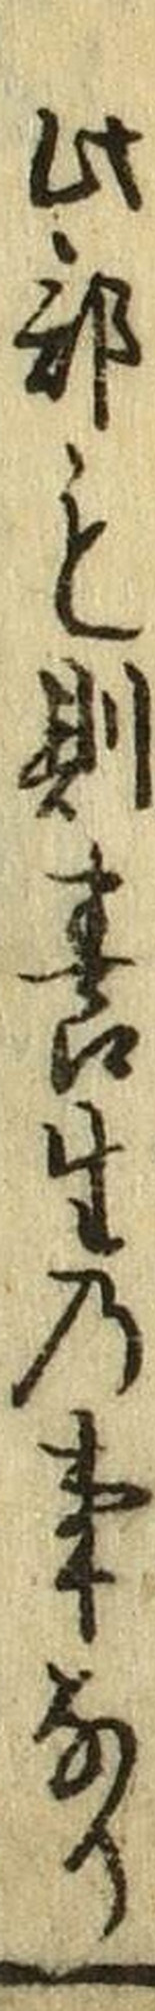此部も則養生の事なり
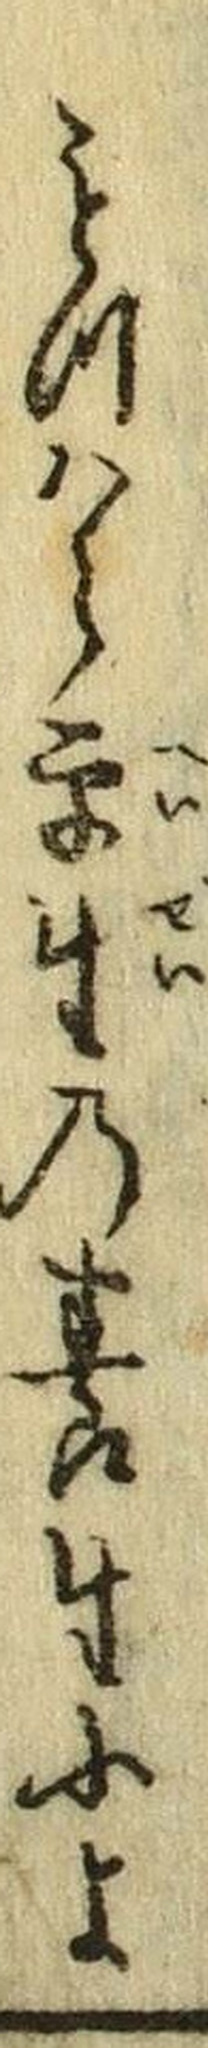もつはら平生の養生によ
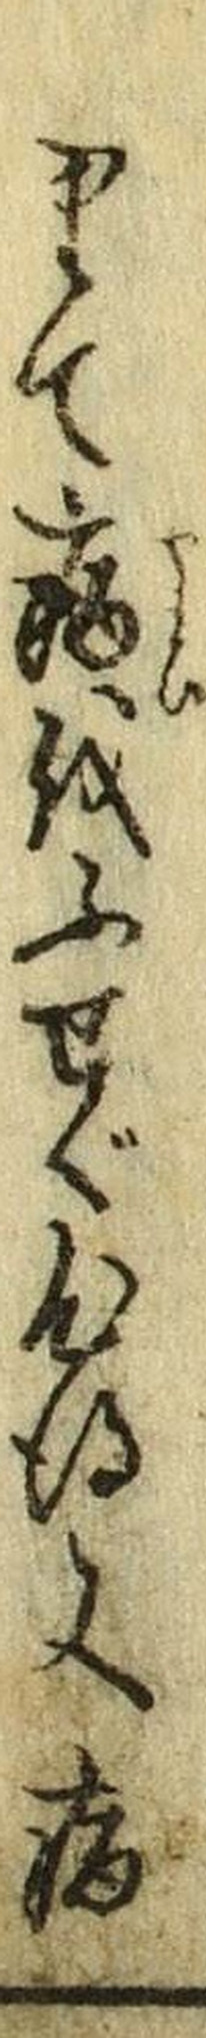りて病をふせぐ心得又病
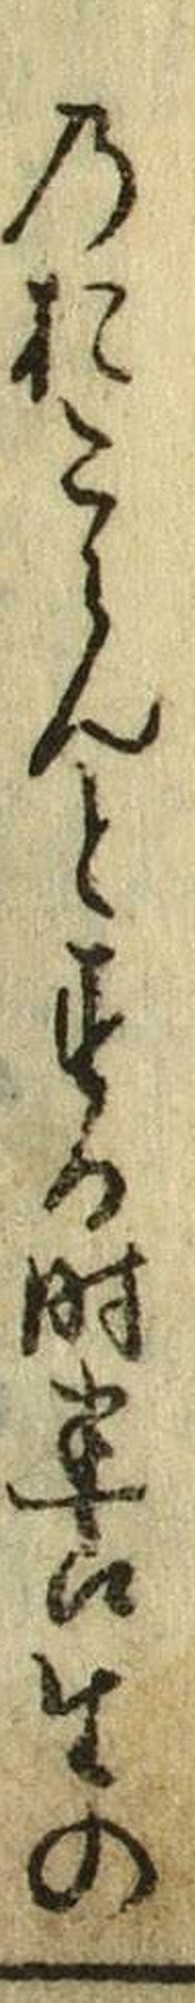のおこらんとする時養生の
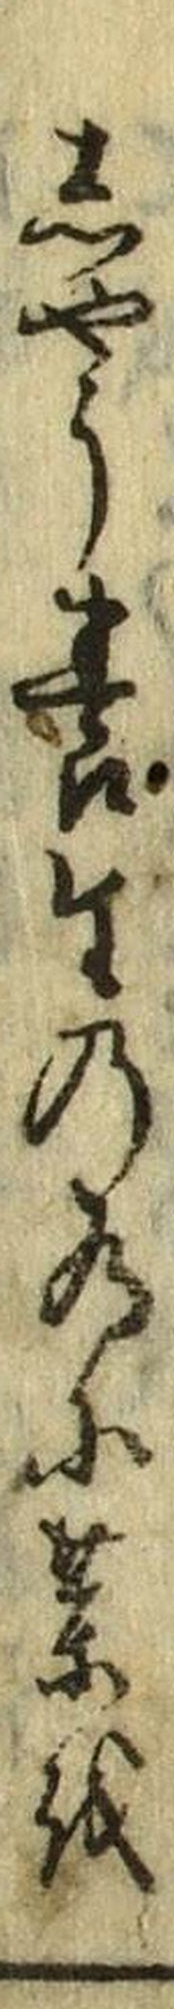しやう養生の為に薬を

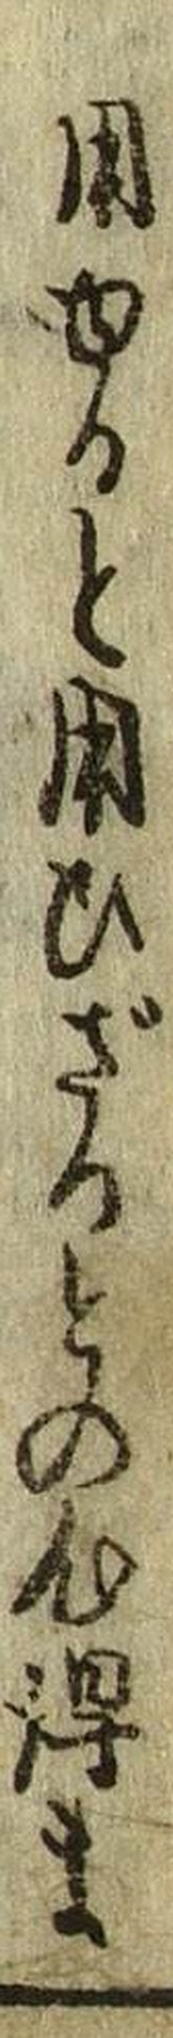用ゆると用ひざるとの心得ま
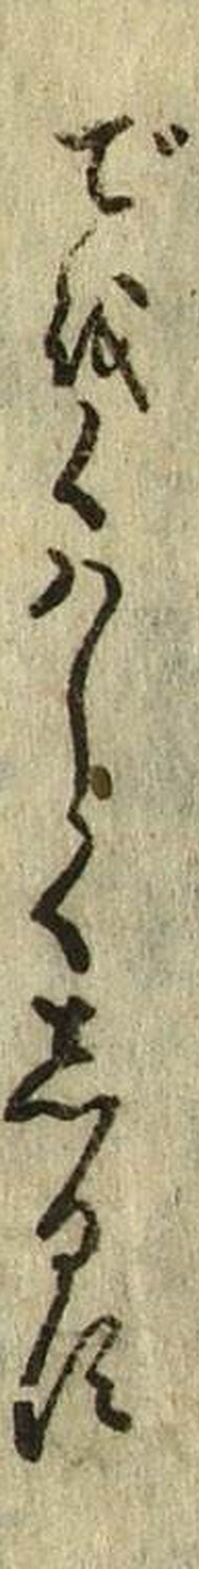でをくはしくしるす
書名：居家養生記
